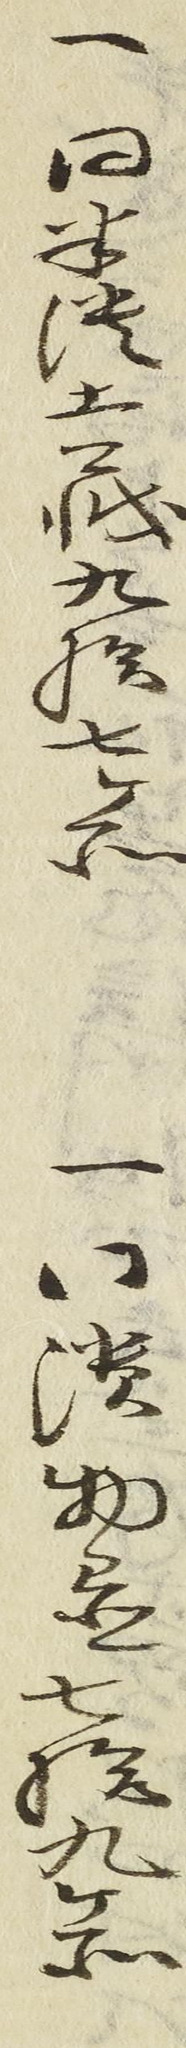一同半潰土蔵九拾七ヶ所一同潰物置七拾九ヶ所
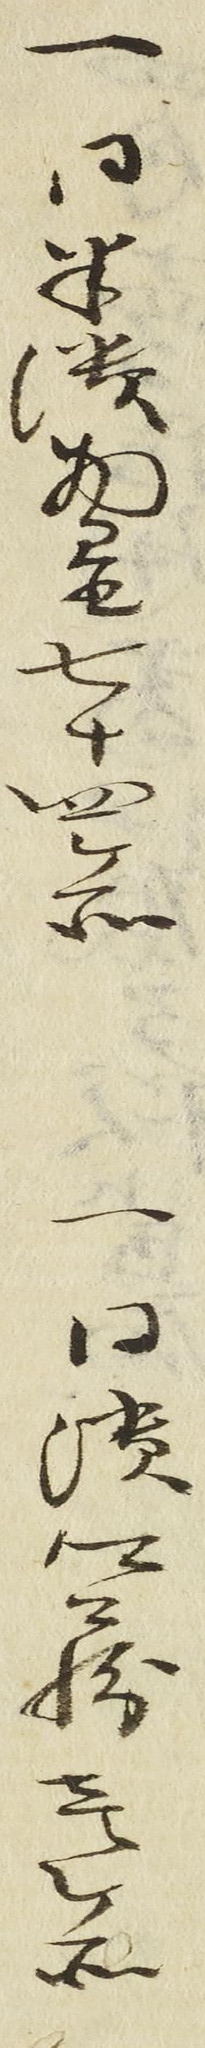一同半潰物置七四ヶ所一同潰郷蔵壱ヶ所一
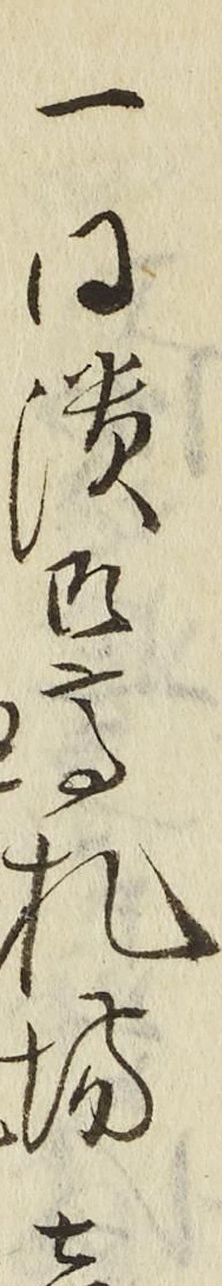一同潰御高札場壱ヶ所
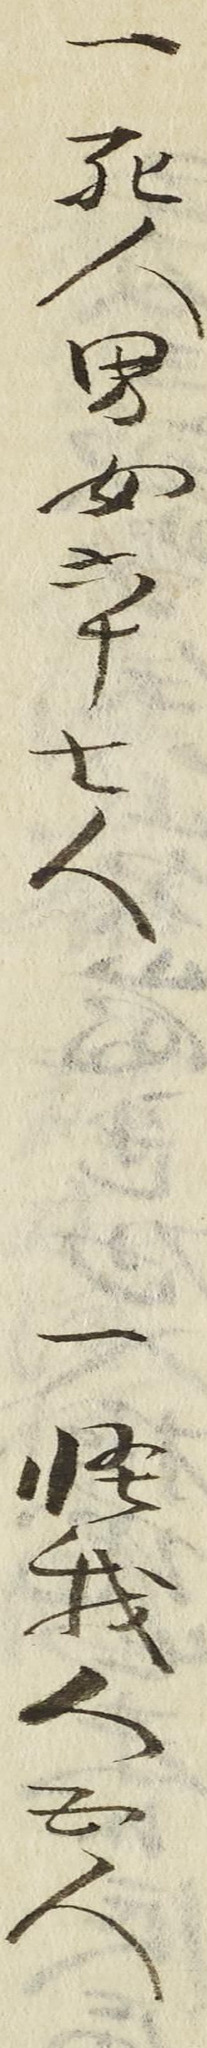一死人男女六十七人一怪我人五人
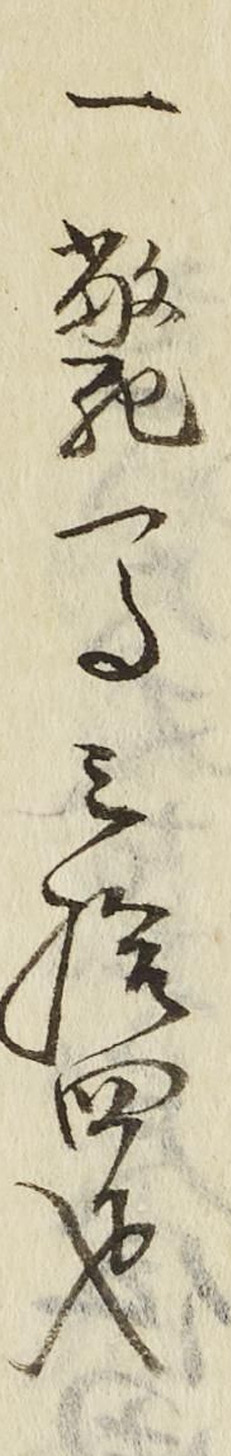一弊馬三拾四也
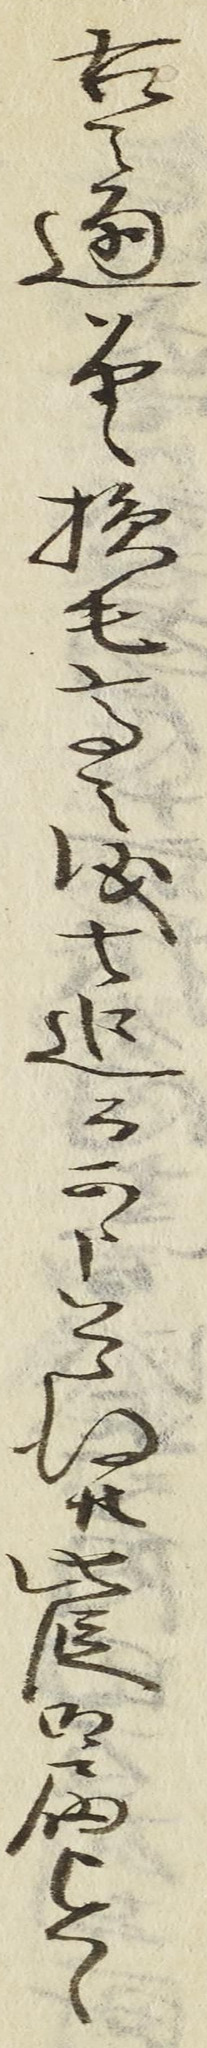右之通御坐候損毛高之儀は追而可申上候得共此段御届申上候
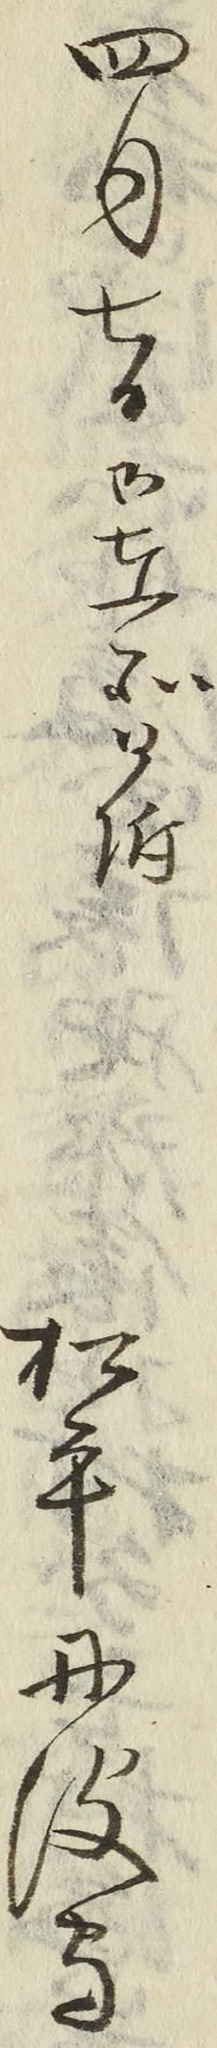四月七日御在所日附松平丹後守

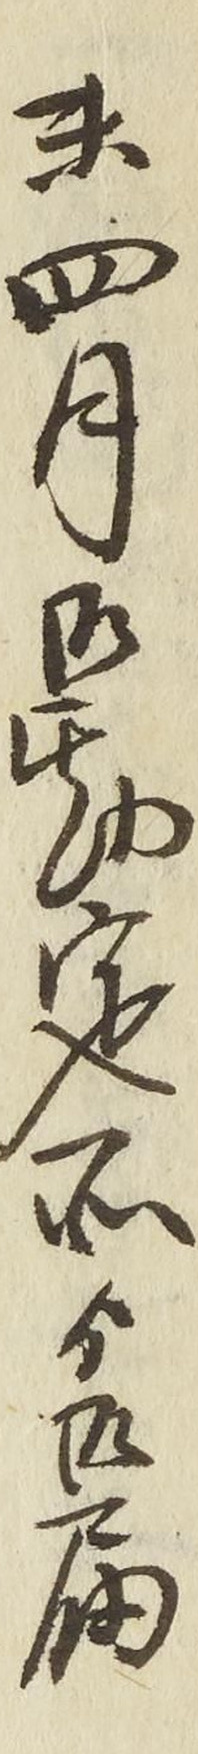未四月御勘定所ゟ御届
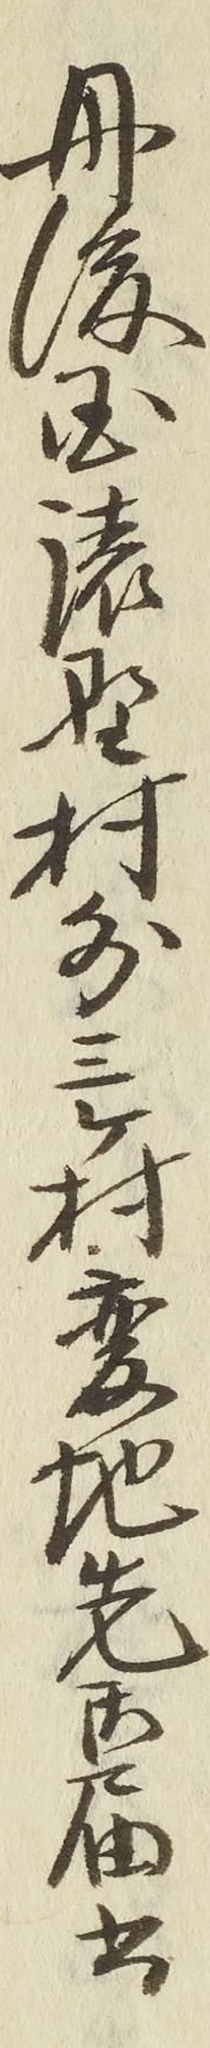丹後国俵野村分三ヶ村変地先御届書
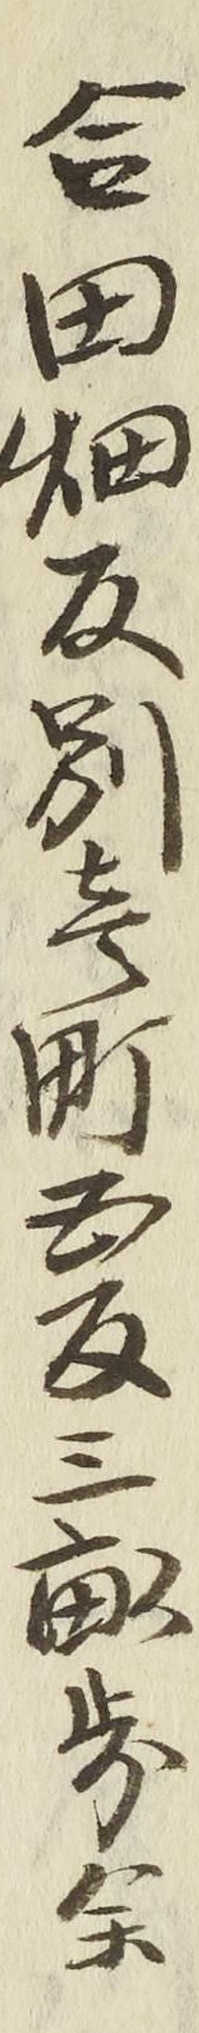合田畑反別壱町五反三畝歩余
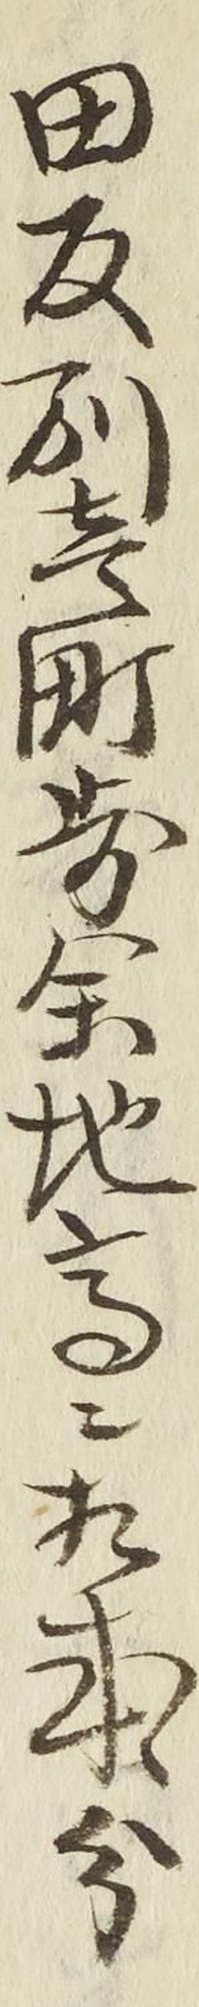田反別壱町歩余地高二相成分
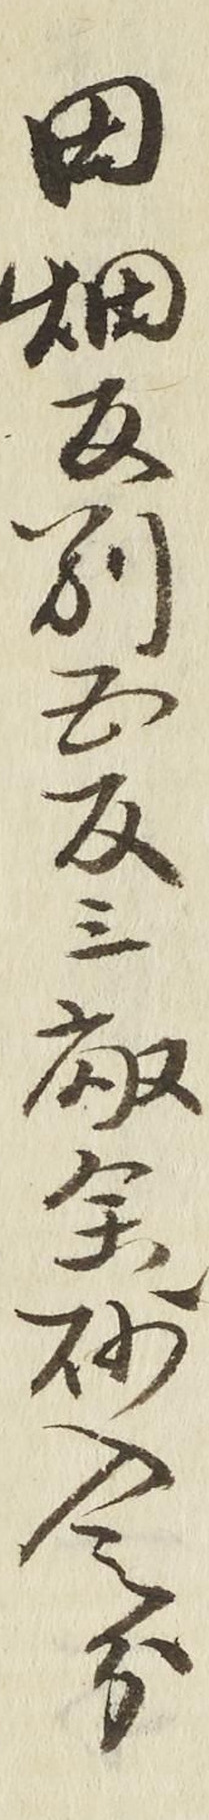田畑反別五反三畝余砂入之分
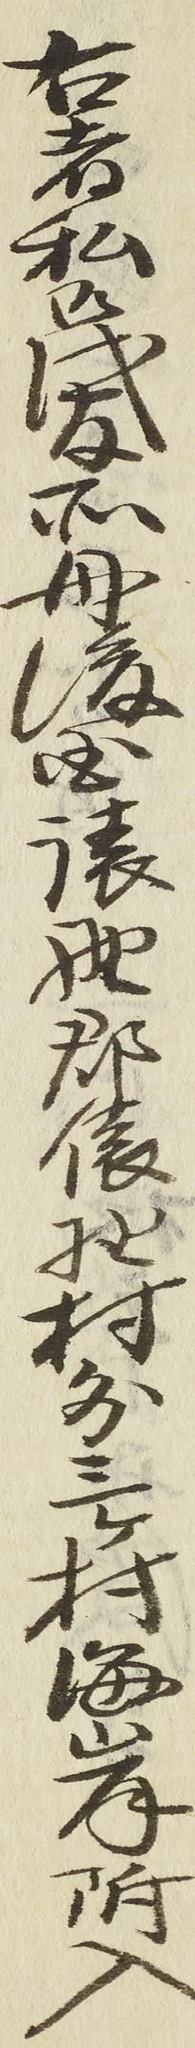右は私御代官所丹後国俵野郡俵野村分三ヶ村海岸附入
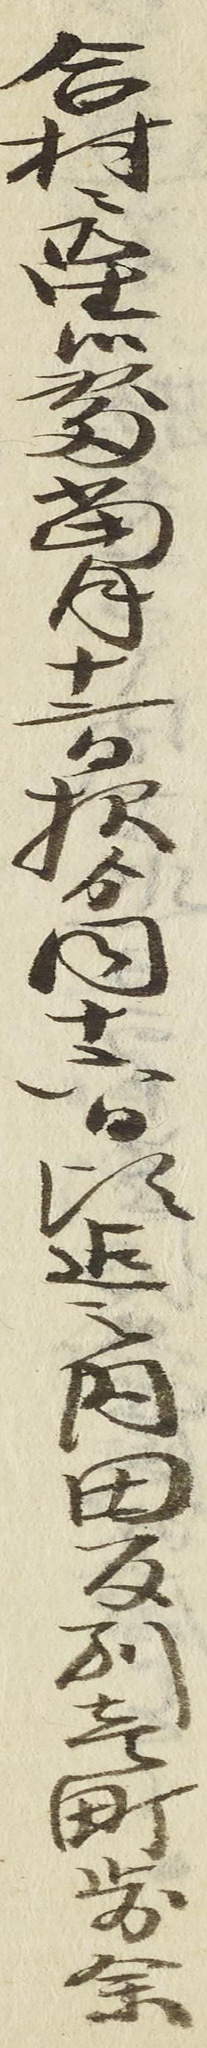合村二御坐候処当月十二日夜ゟ同十六日頃迄之内田反別壱町歩余
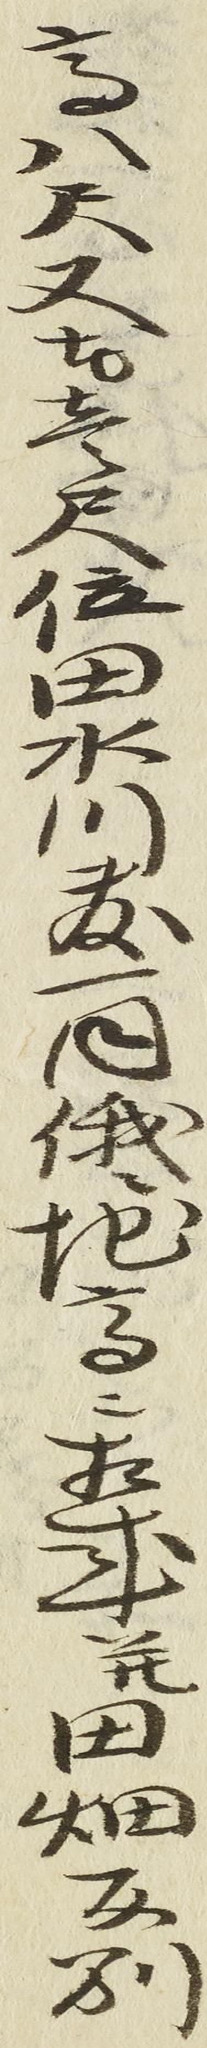高八尺又は壱尺位田水川敷一同俄二地高二相成并田畑反別
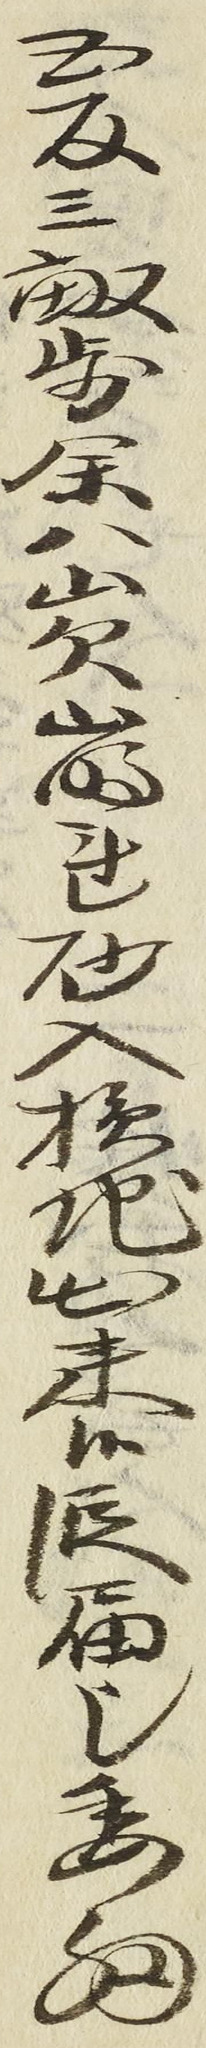五反三畝歩余ハ山欠崩れ砂入様地出来候段届申候委細
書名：信濃國大地震記　乾
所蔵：東京大学地震研究所図書室 Earthquake Research Institute Library, The University of Tokyo, JAPAN
